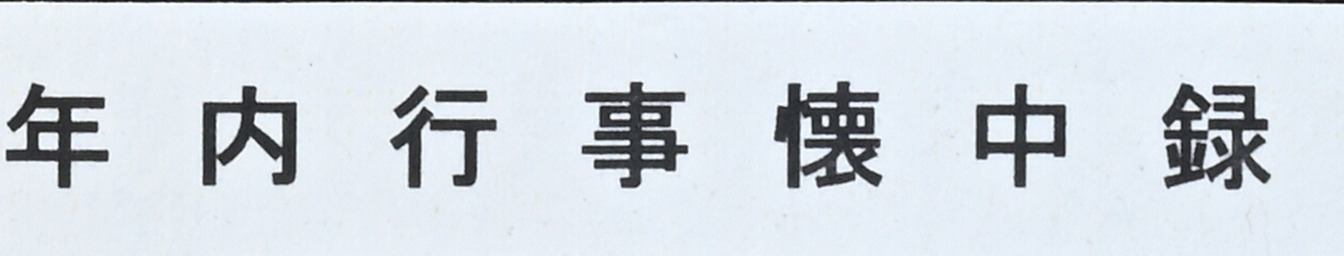年内行事懐中録
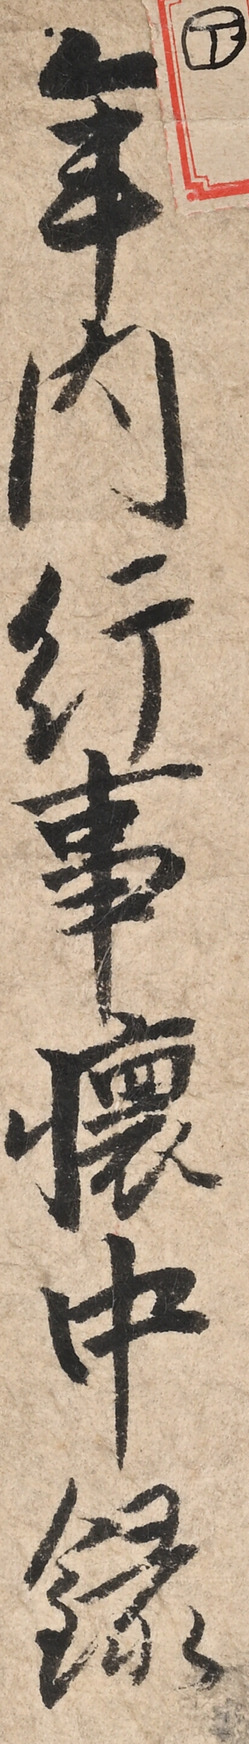年内行事懐中録
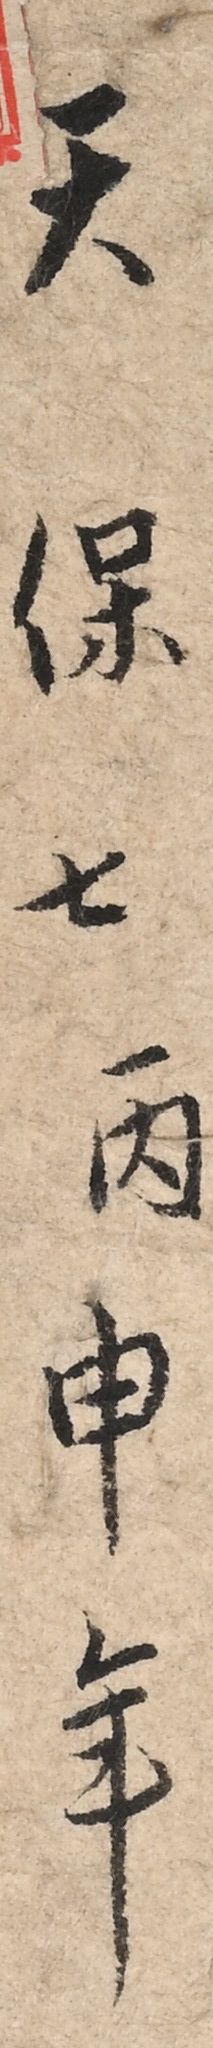天保七丙申年
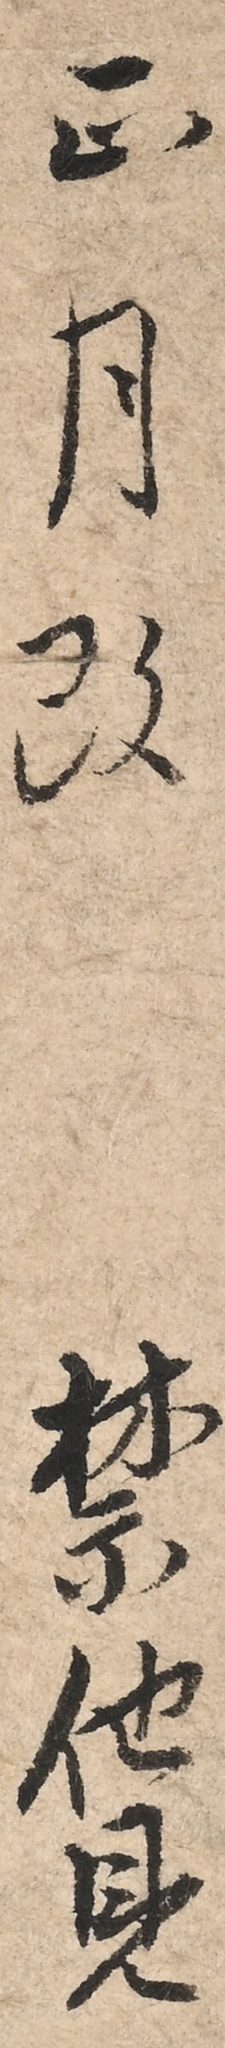正月改禁他見

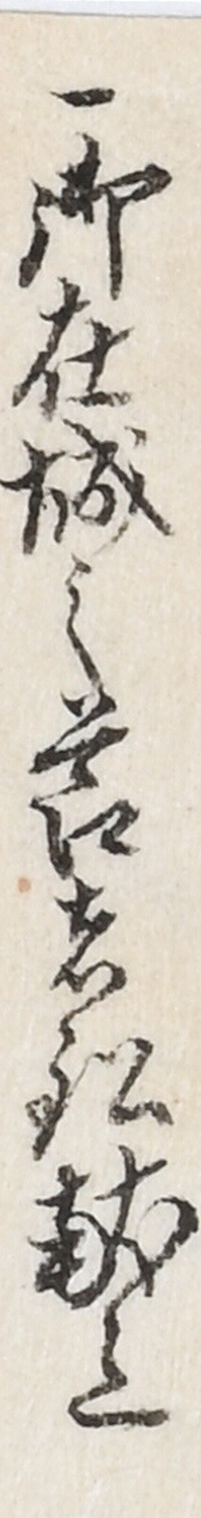一御在城之節者鉛献上
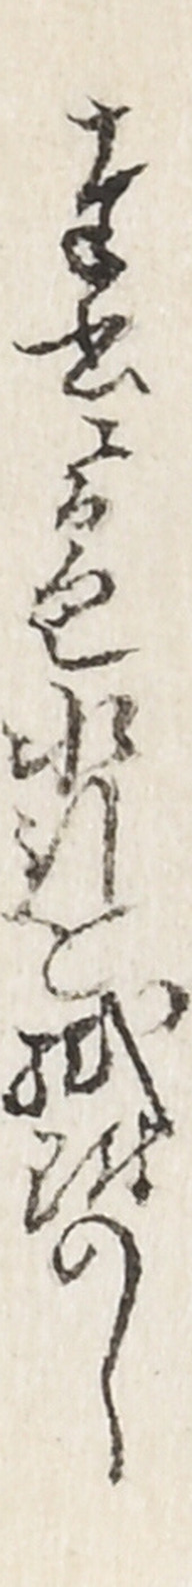奉書ニ而色水引を掛附のし
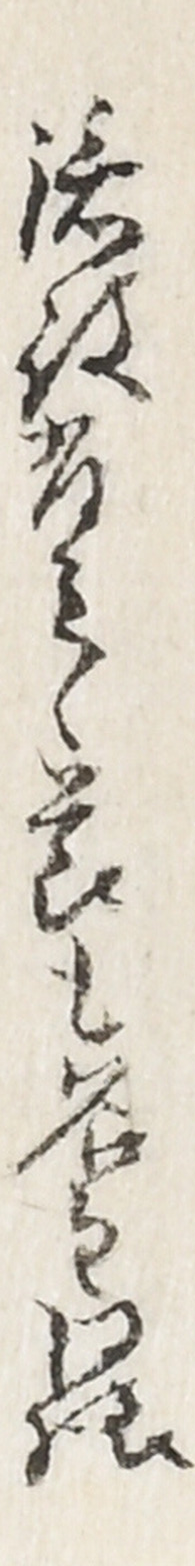添役有之候節も名主同様
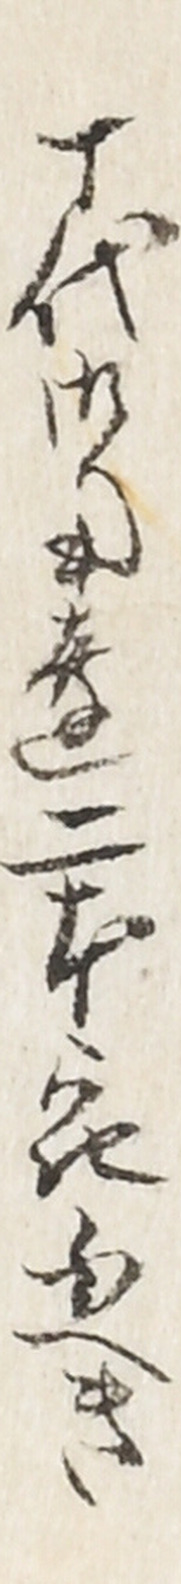丁代御用達二本宛ふへき
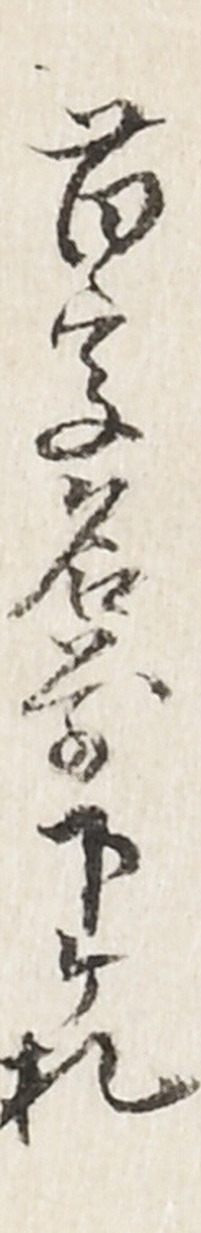苗字名前下ヶ札
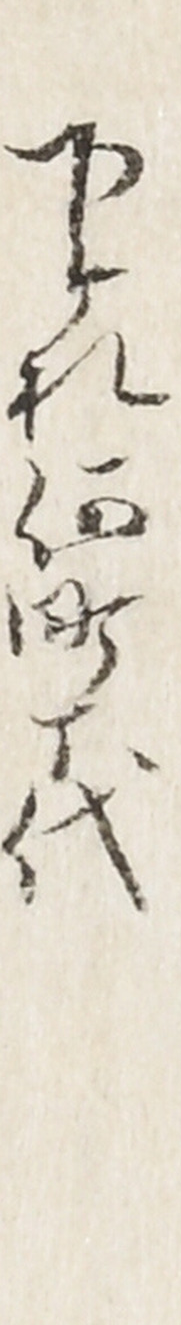下ヶ札何町丁代
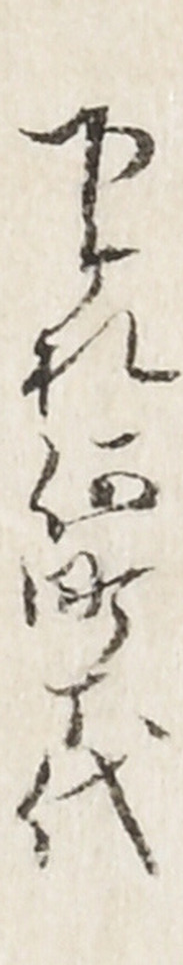下ヶ札何町丁代
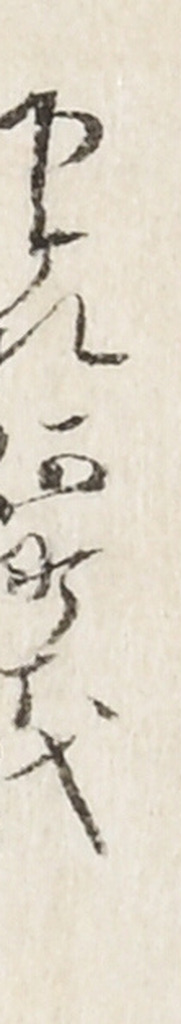下ヶ札何町丁代
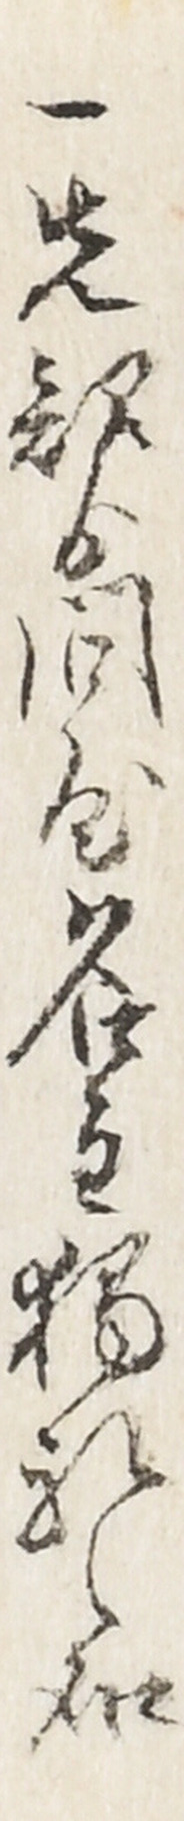一先規より問屋名主独礼候処
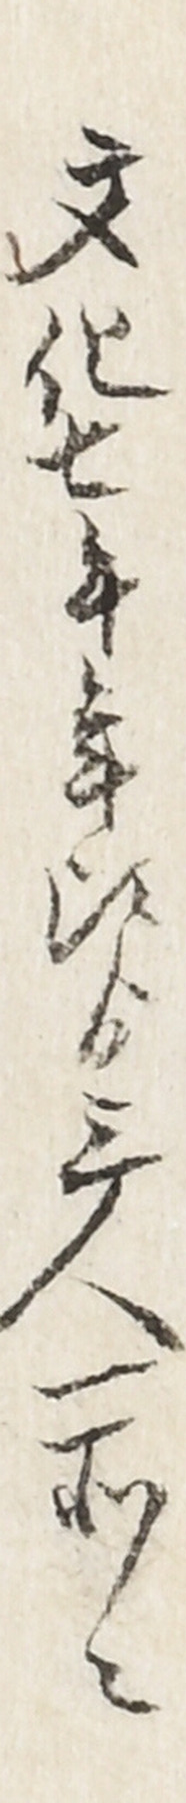文化七午年頃ゟ三人一所ニ
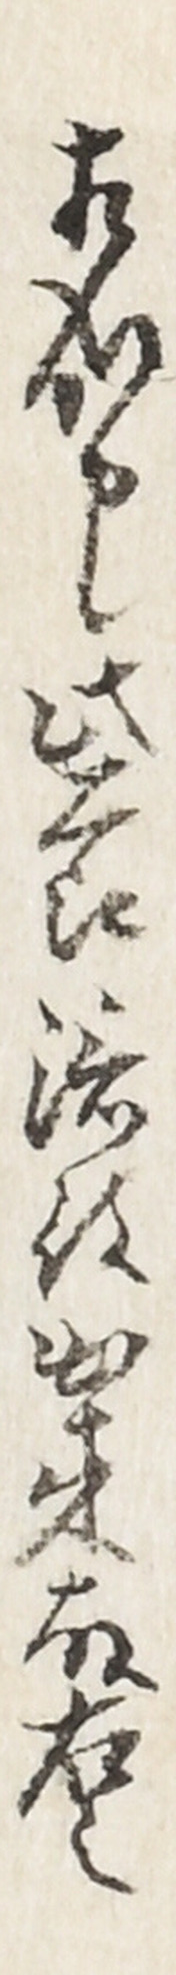相成申候此節添役出来故右之
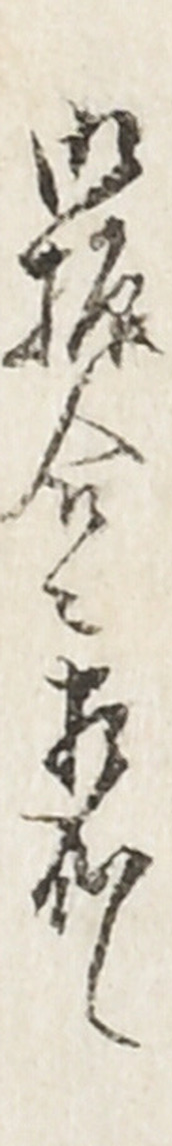御振合ニ相成候
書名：年内行事懐中録
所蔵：伊那市立高遠町図書館・合同会社AMANE
